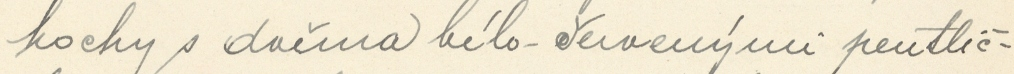hochy s dvěma bílo-červenými pentlič-
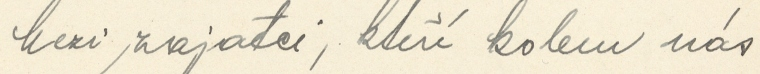Mezi zajatci, kteří kolem nás
